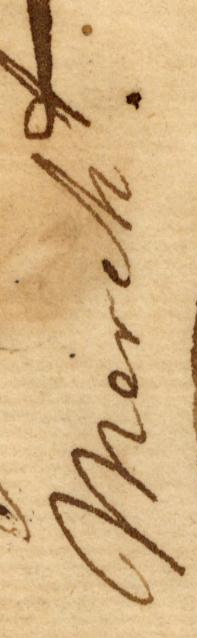Merch^t
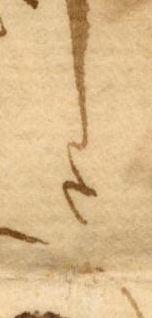in
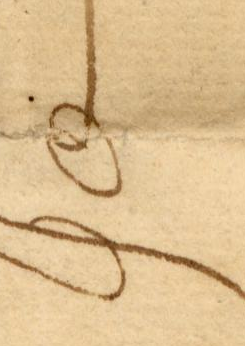To
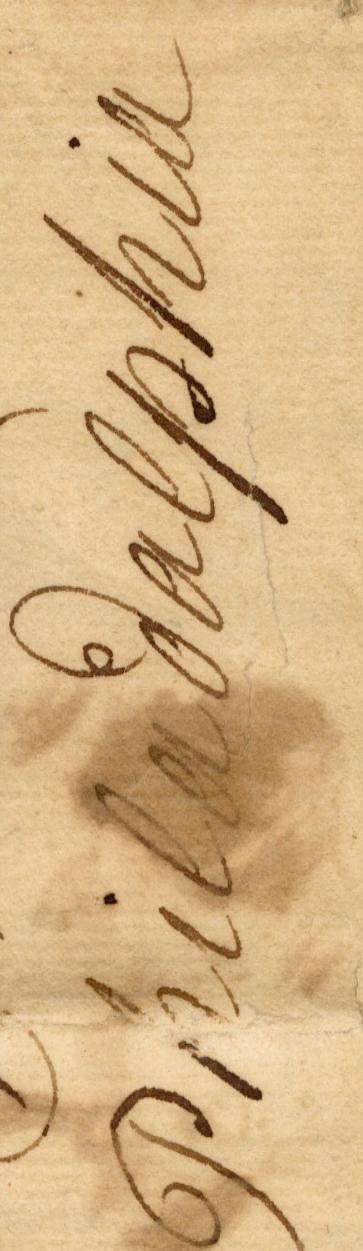Philadalphia
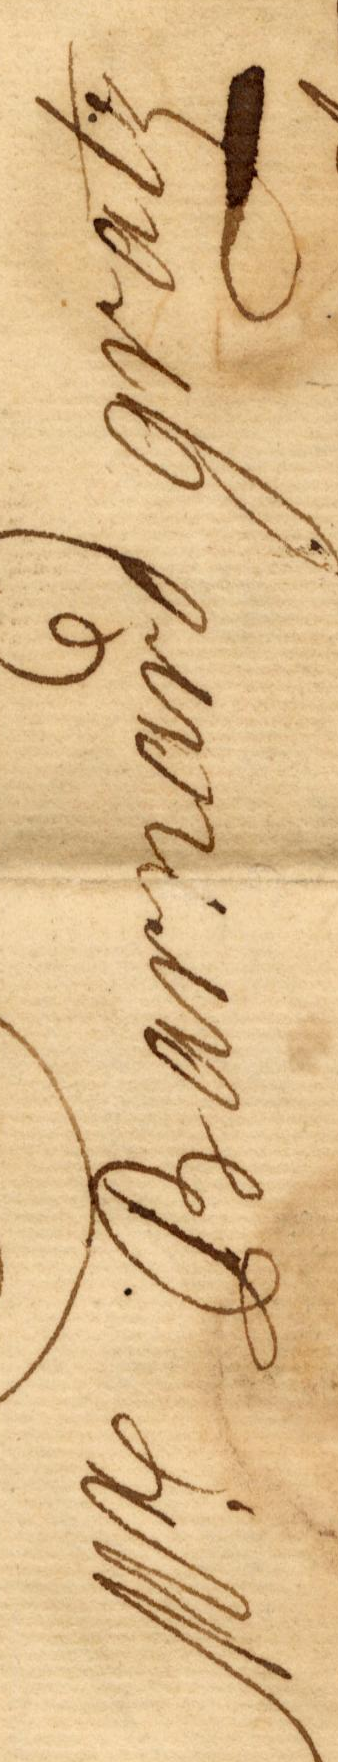M^r Barnard Gratz
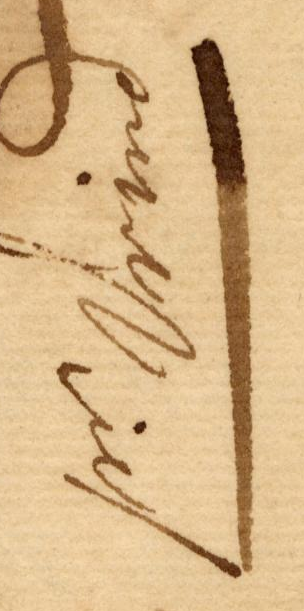p^r. Vrind
